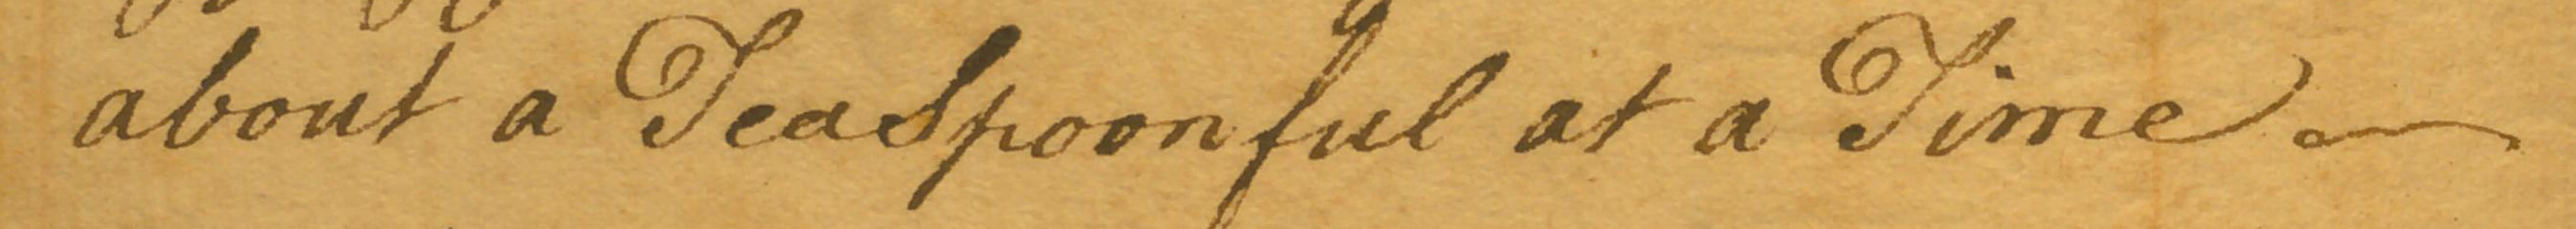about a Teaspoonful at a Time-
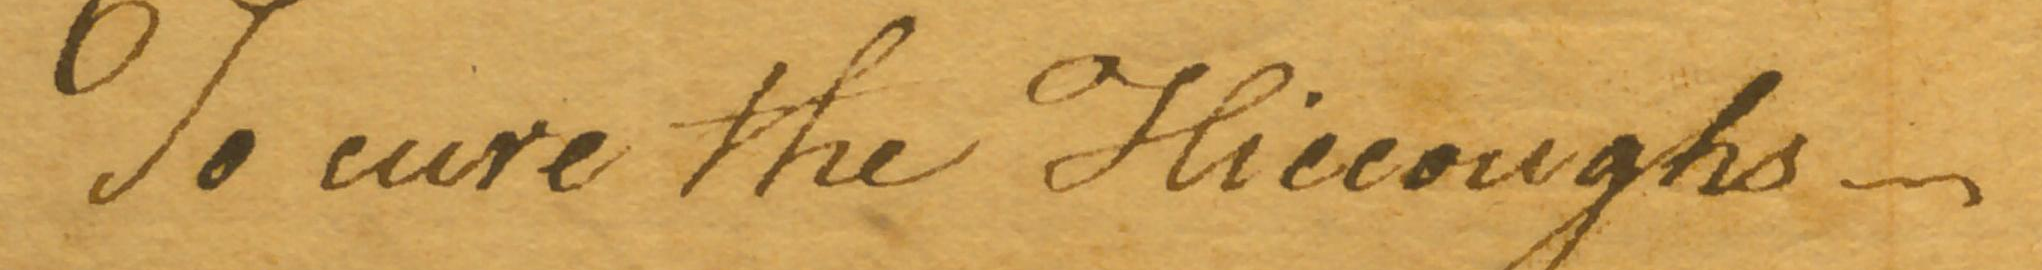To cure the Hiccoughs-
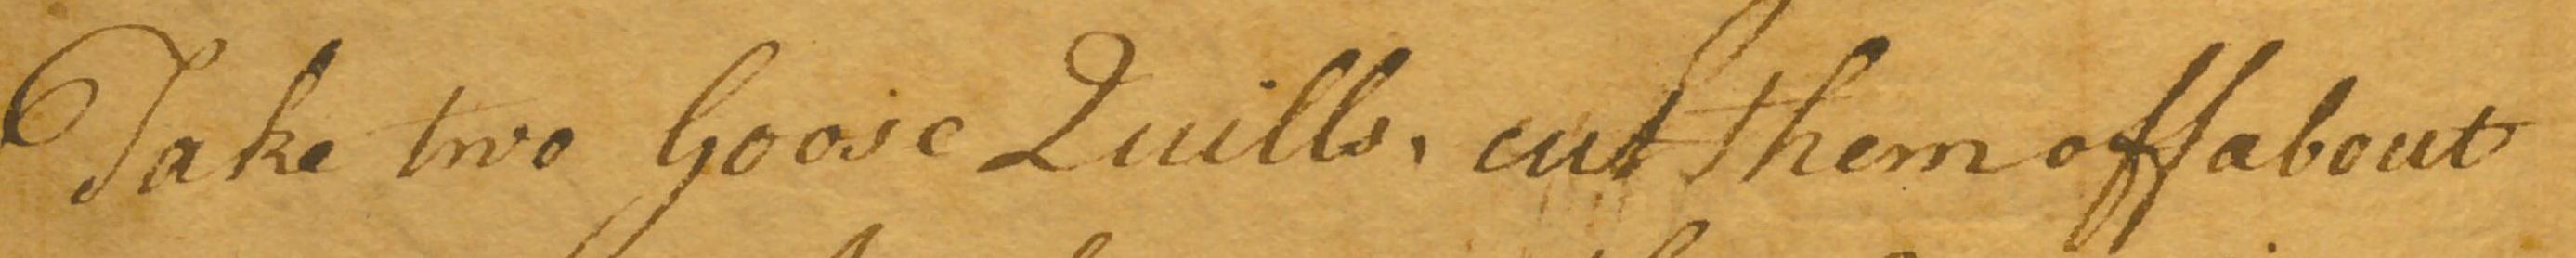Take two Goose Quills, cut them off about
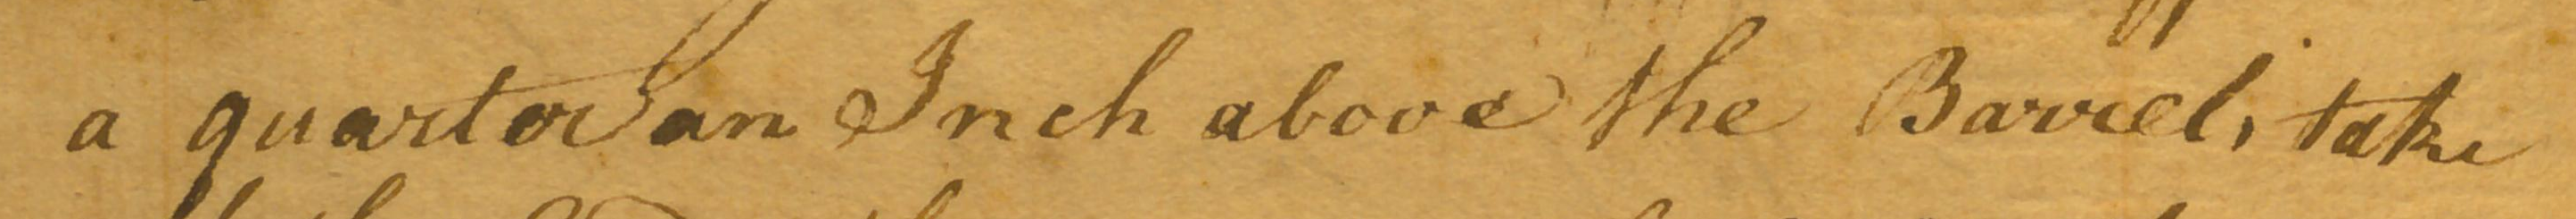a quarter an Inch above the Barrel, take
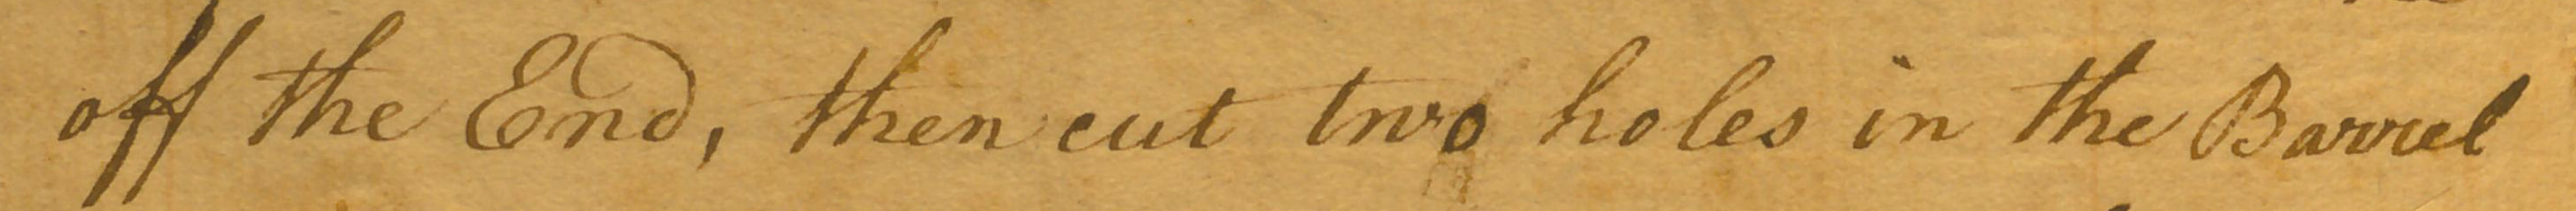off the End, then cut two holes in the Barrel
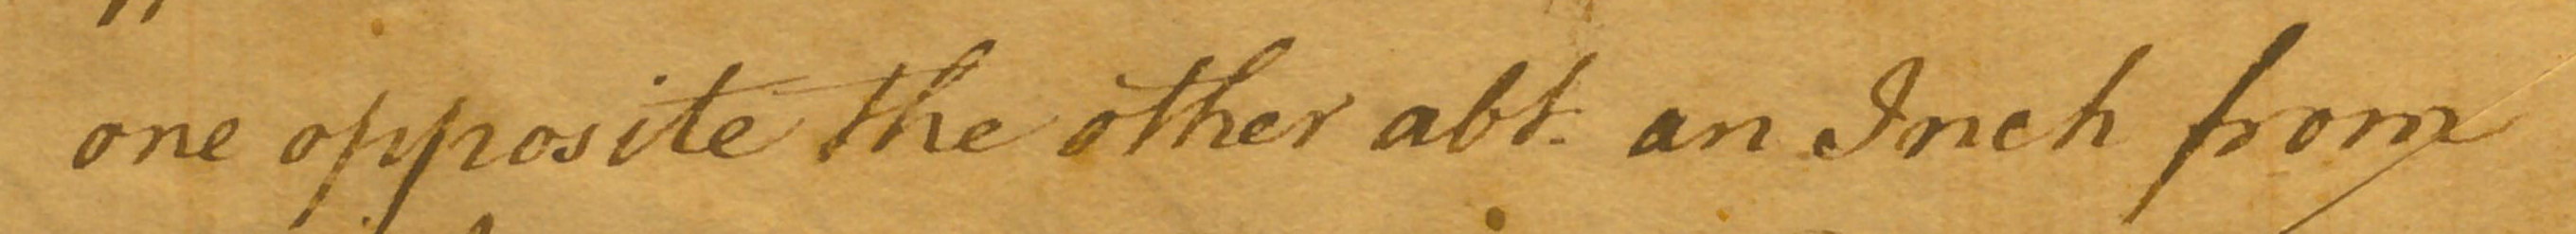one opposite the other abt. an Inch from
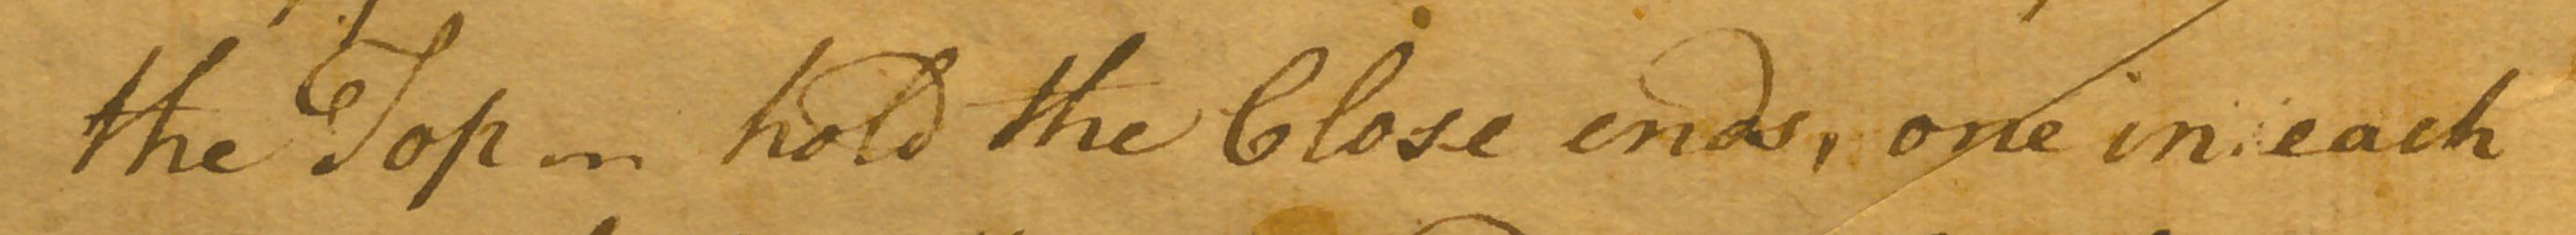the Top- hold the Close ends, one in each
